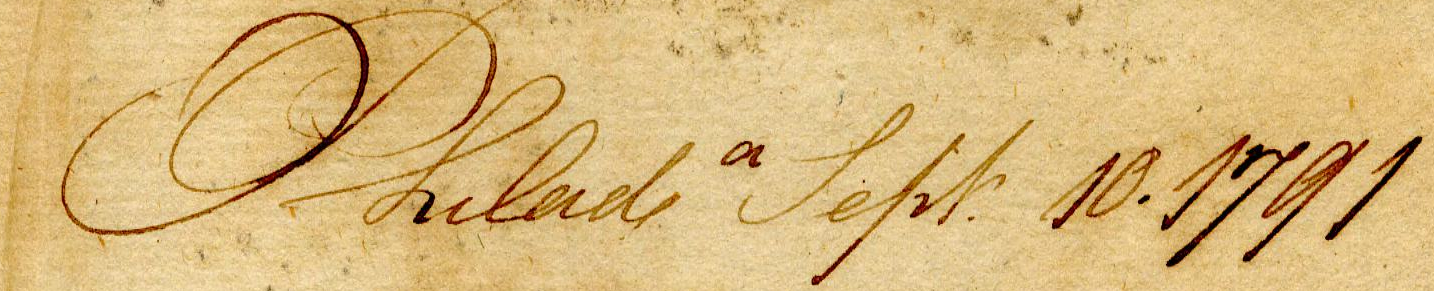Philad^a Sept^r 10. 1791
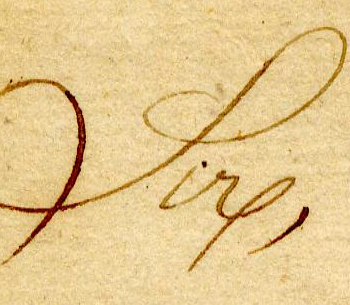Sir,
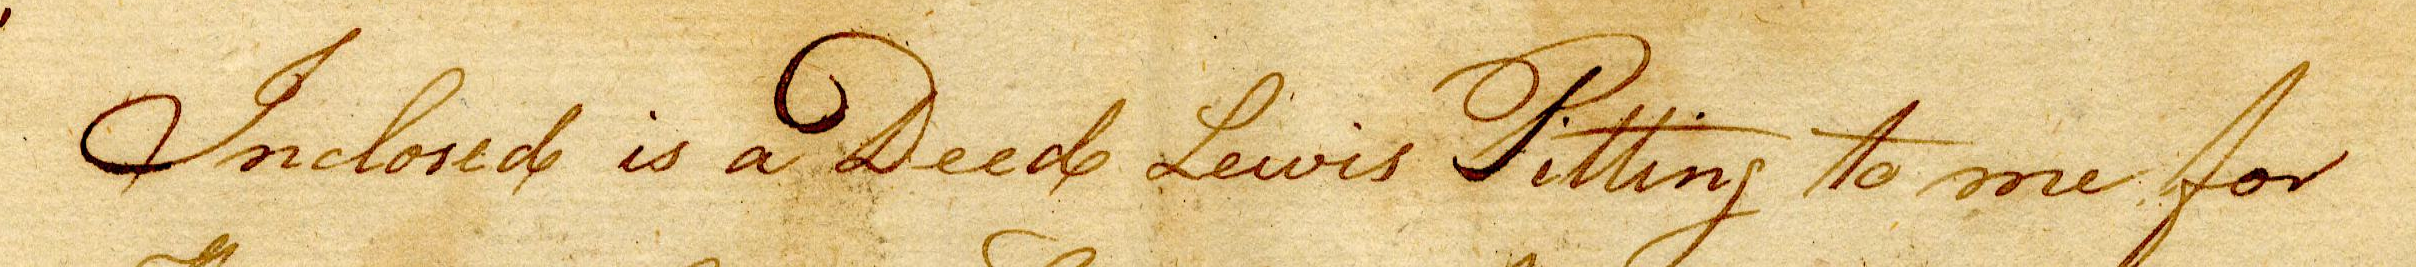Inclosed is a Deed Lewis Pitting to me for
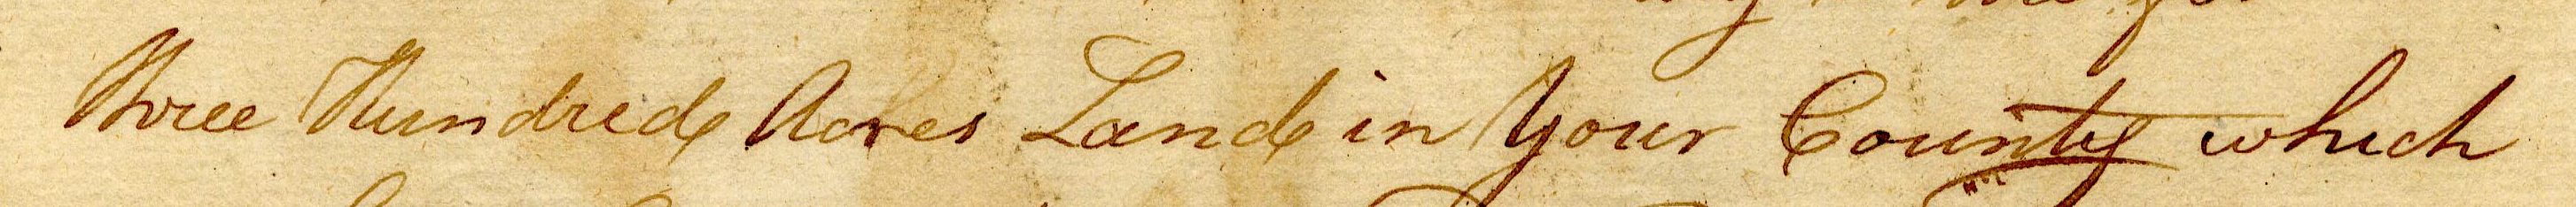three Hundred Acres Lands in your County which
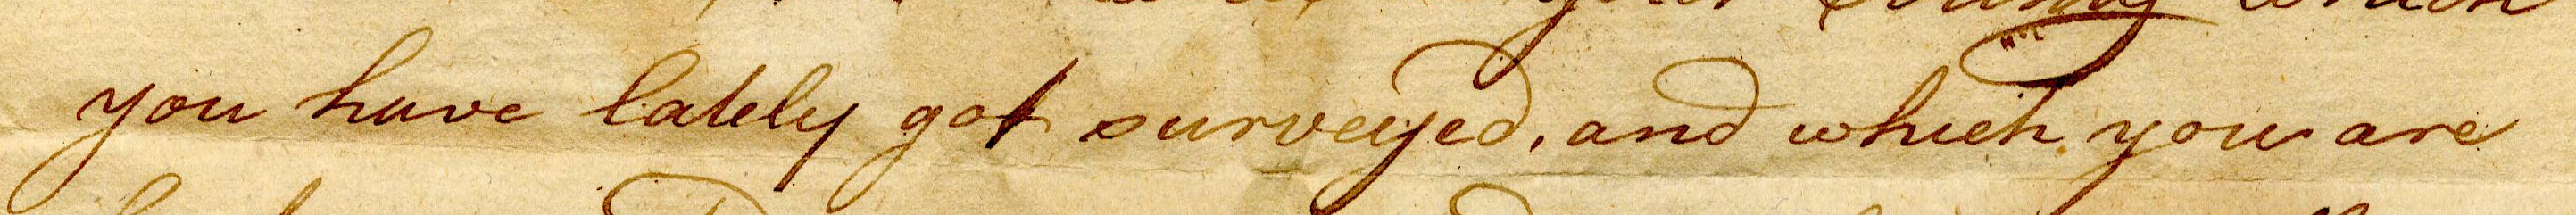you have lately got surveyed, and which you are
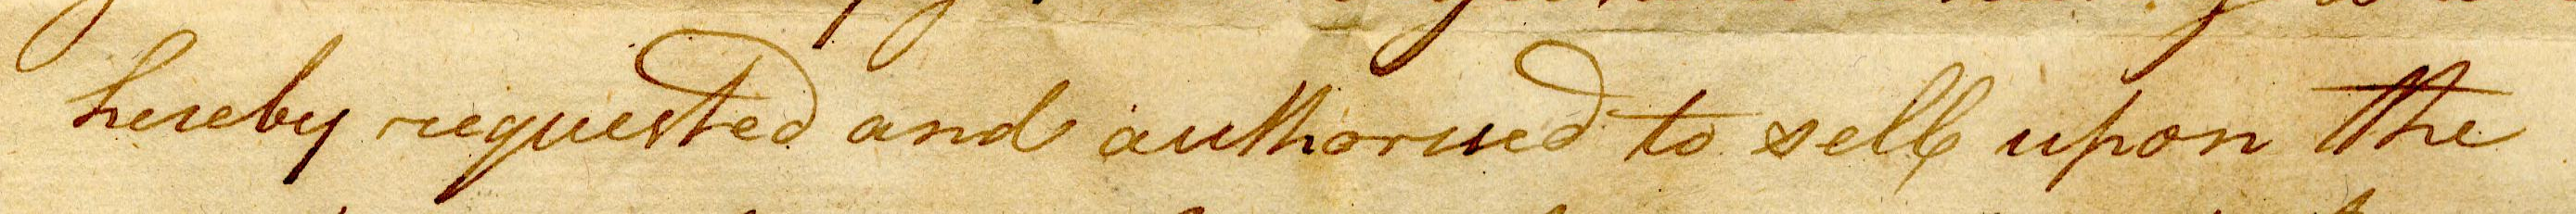hereby requested and authorized to sell upon the
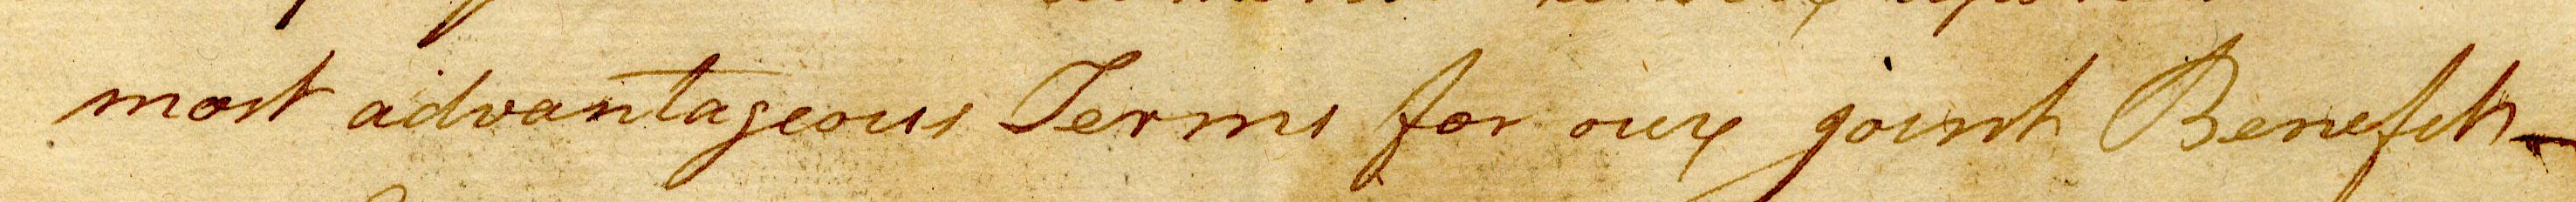most advantageous Terms for our joint Benefit
